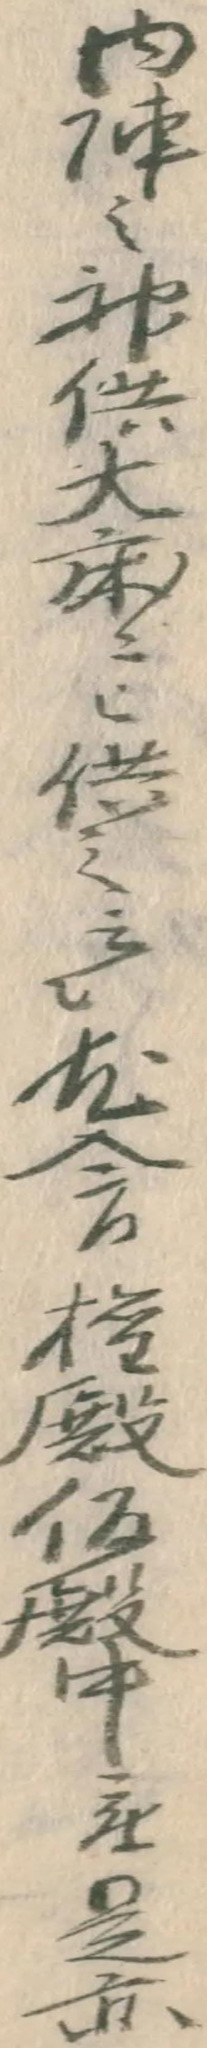内陣之神供大床ニ被供之云々尤今日権殿仮殿中ニ付是亦
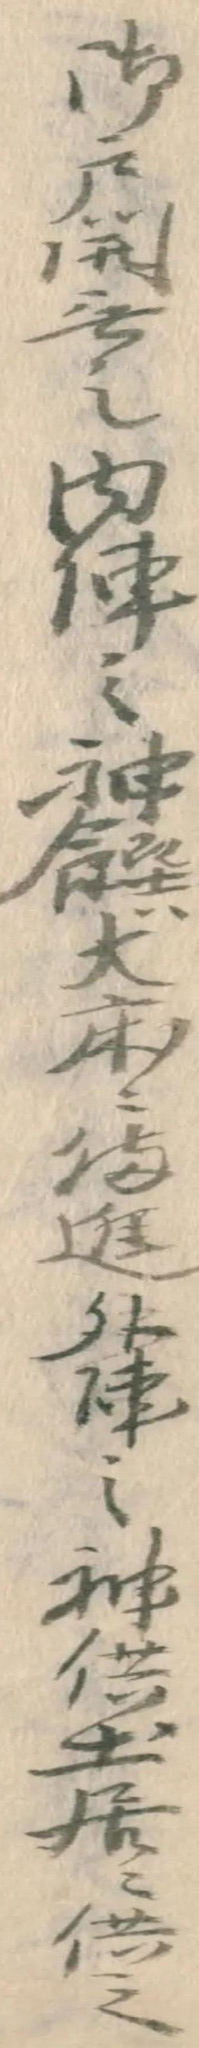御戸開無之内陣之神饌大床に備進外陣之新供土居に供之
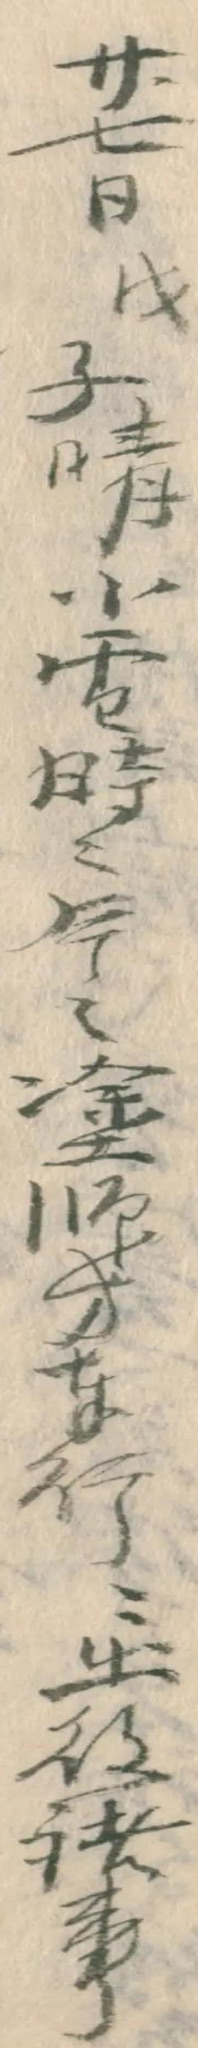廿七日戊子晴小雪時々片々塗師方奉行ニ出役諸事
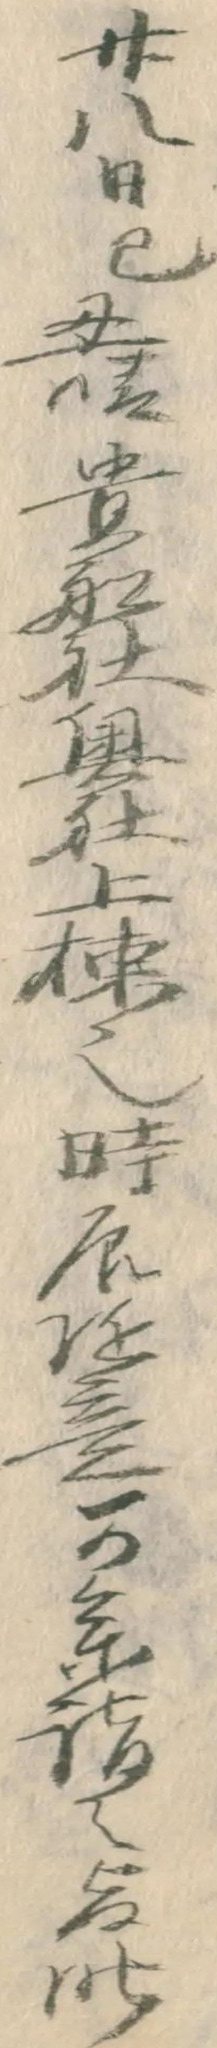廿八日己丑晴貴舩社奥社上棟也時辰随意可参詣之旨昨
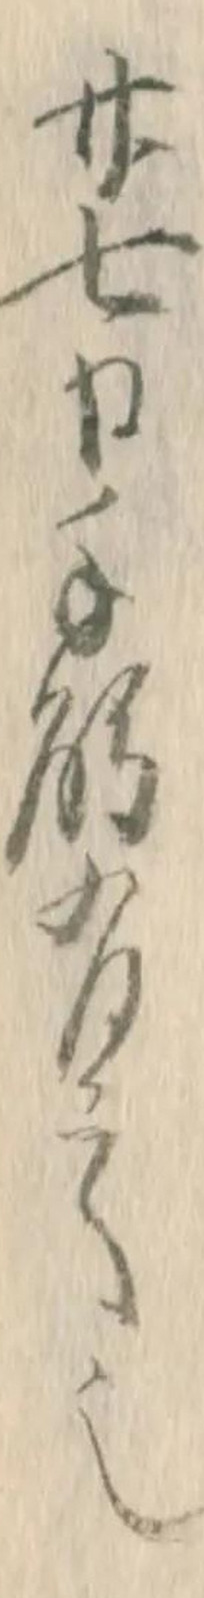廿七日手觸有之也

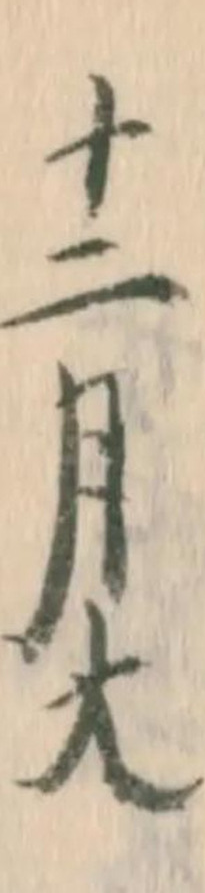十二月大
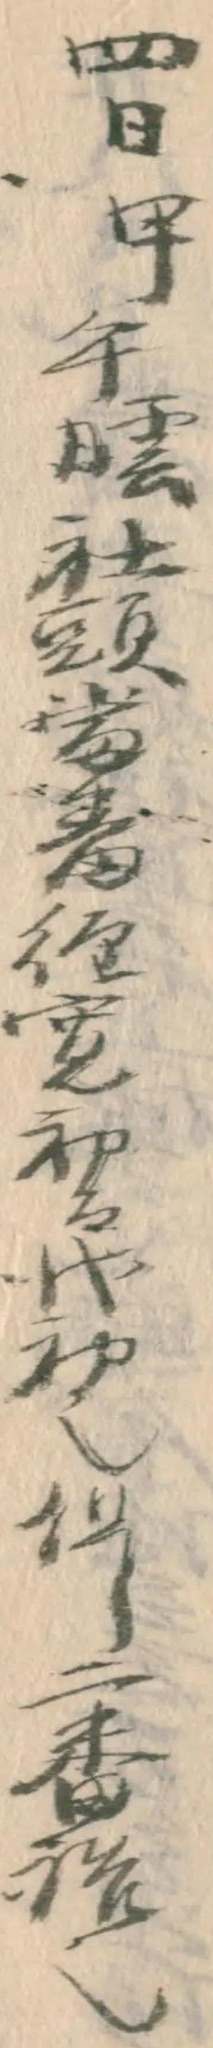四日甲午曇社頭當番経寛初而代勤也但し二番詰也
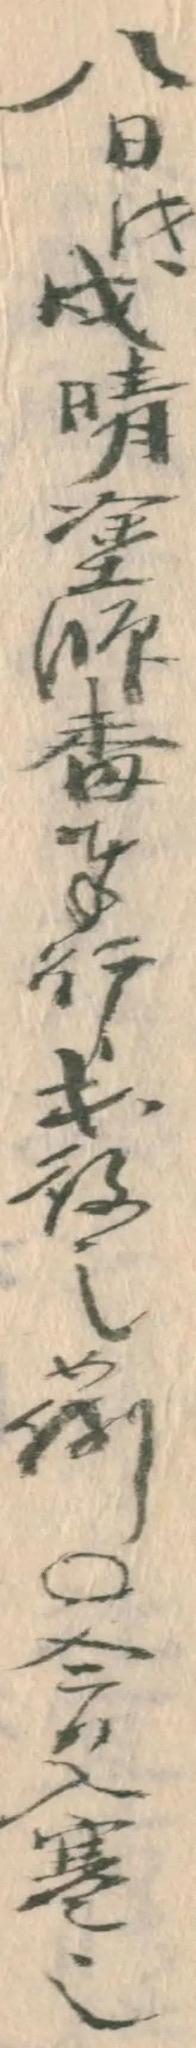八日戊戌晴塗師番奉行出役也如例○今日入寒也
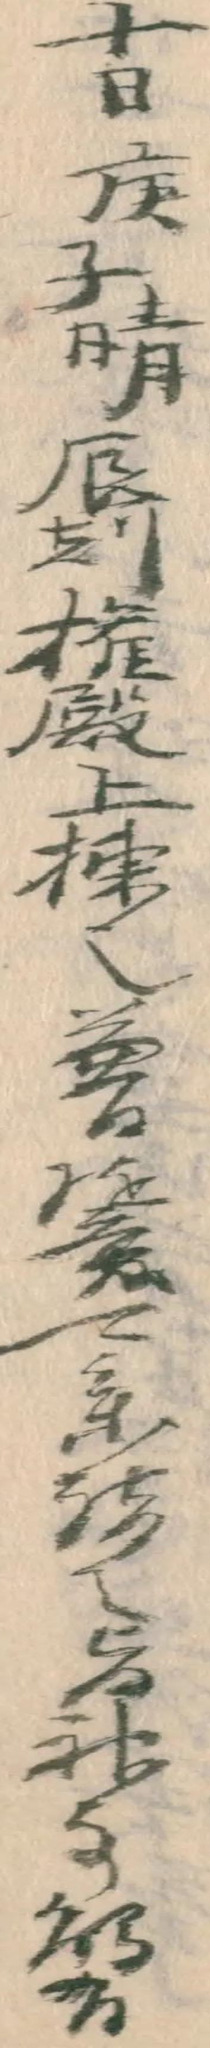十日庚子晴辰刻権殿上棟也兼日随意可参詣之旨神事觸有
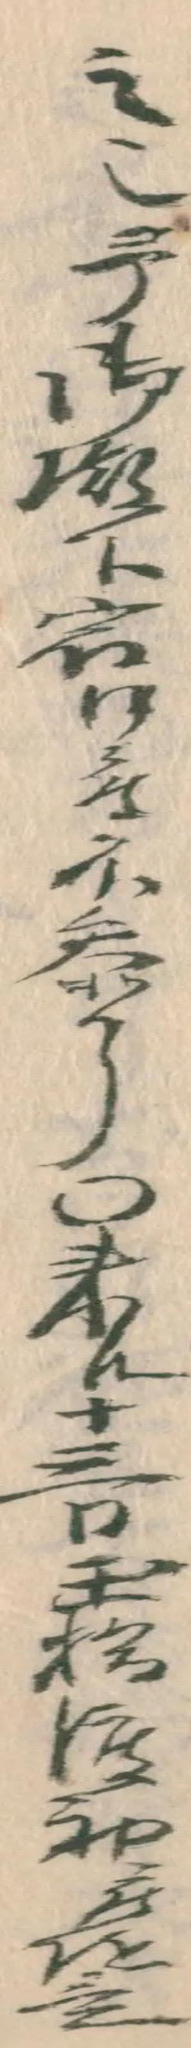之也予御殿下宿候ニ付不参了〇来ル十三日玉橋渡初ニ而随意
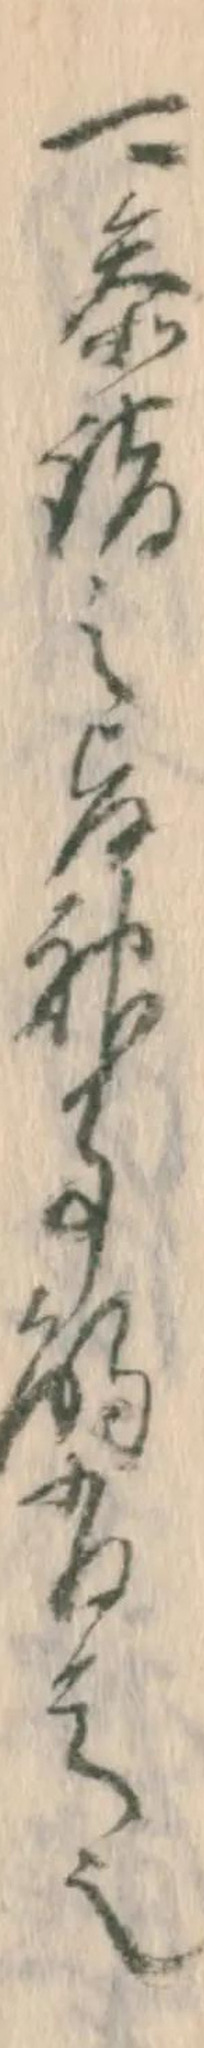可参詣之旨神事觸有之也
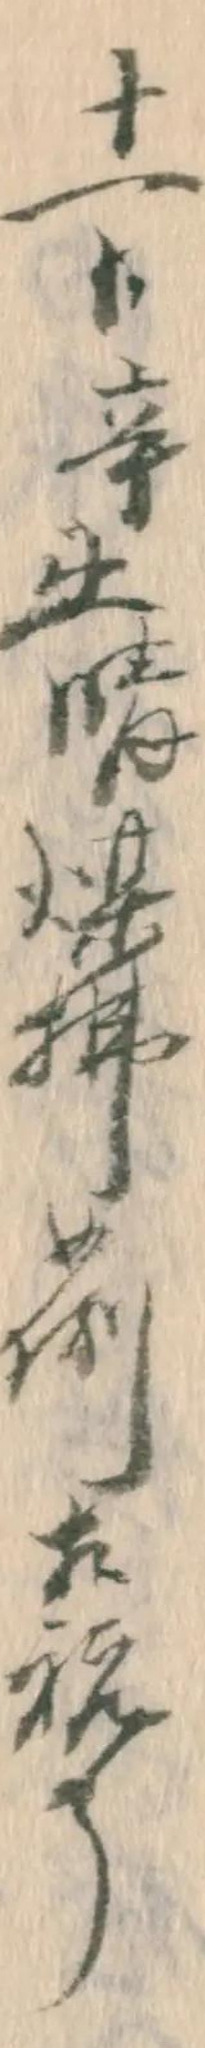十一日辛丑晴煤払如例相祝了
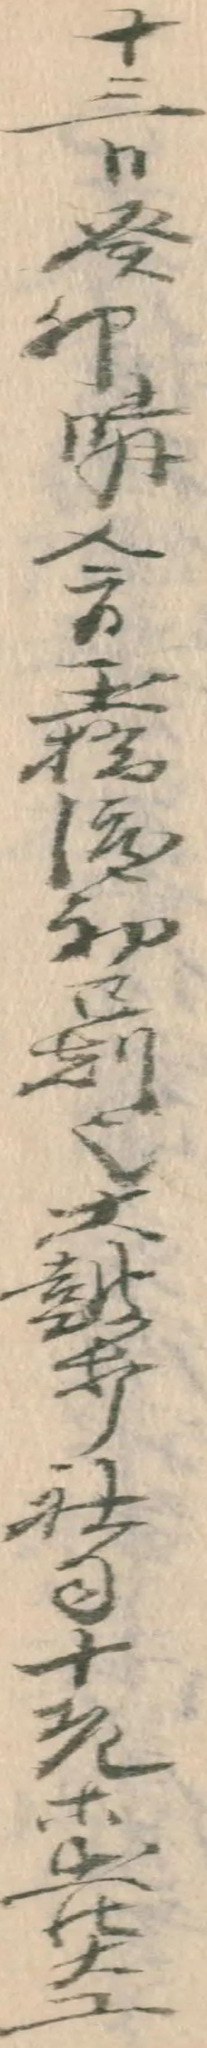十三日癸卯時今日玉橋渡初巳刻也大皷打社司十老等出仕大工
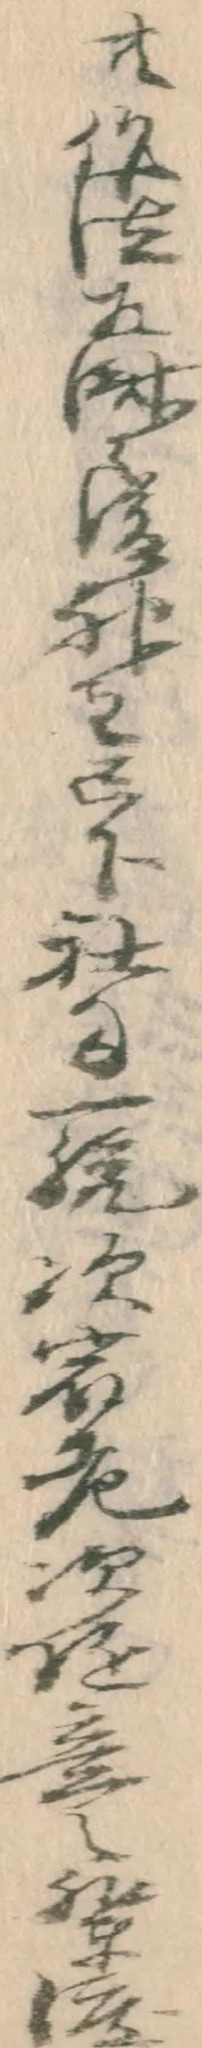共作法相済之後神主已下社司一統次宿老次随意之輩渡
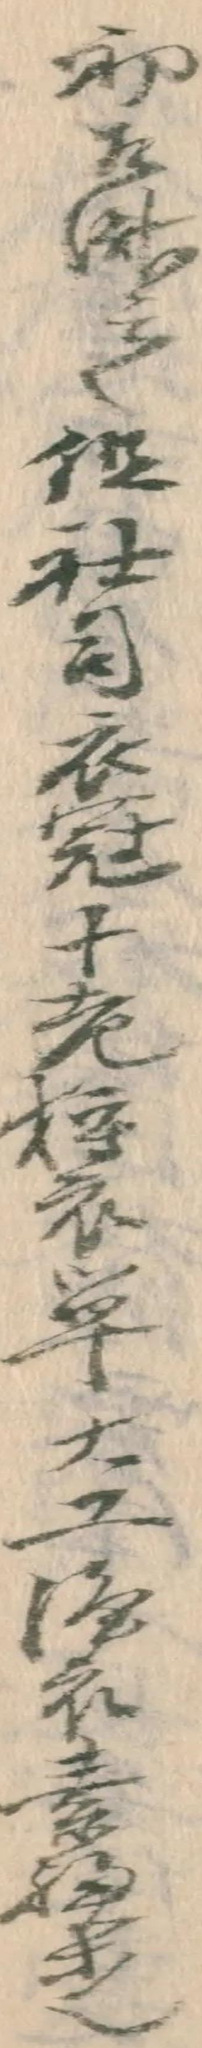初相済云々但社司衣冠十老狩衣単大工浄衣素襖等也
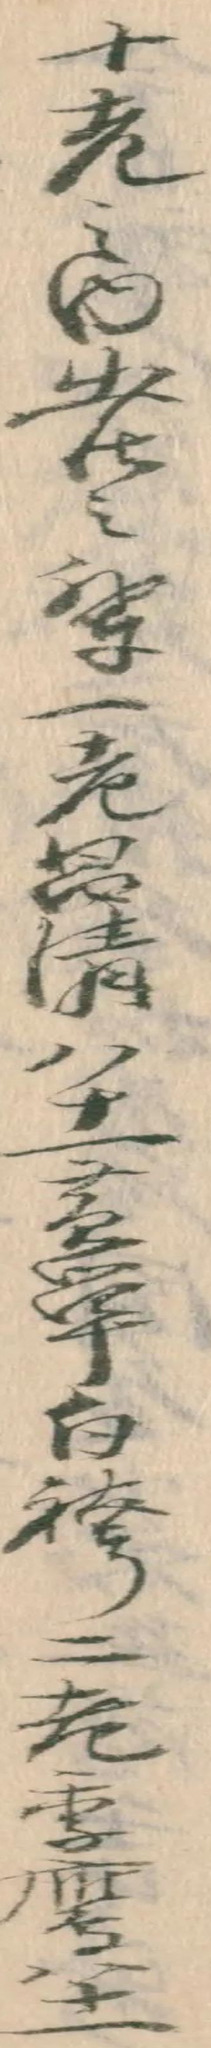十老之内出仕之輩一老昌清八十一黄単白袴二老季鷹八十一
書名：賀茂社記録. 第66冊
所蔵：国立国会図書館 National Diet Library, JAPAN
